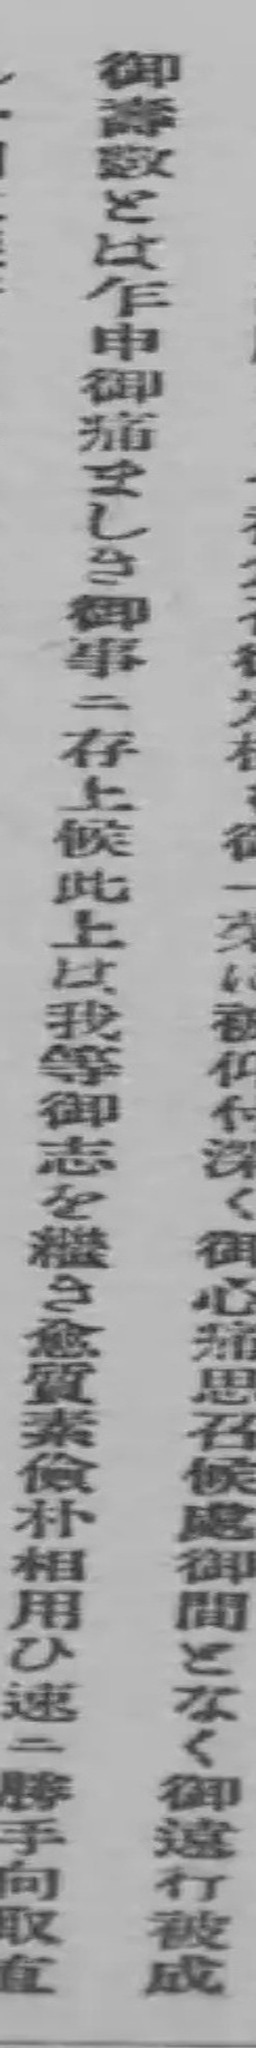御寿数とは乍申御痛ましき御事ニ存上候此上は我等御志を継き愈質素倹朴相用ひ速ニ勝手向取直
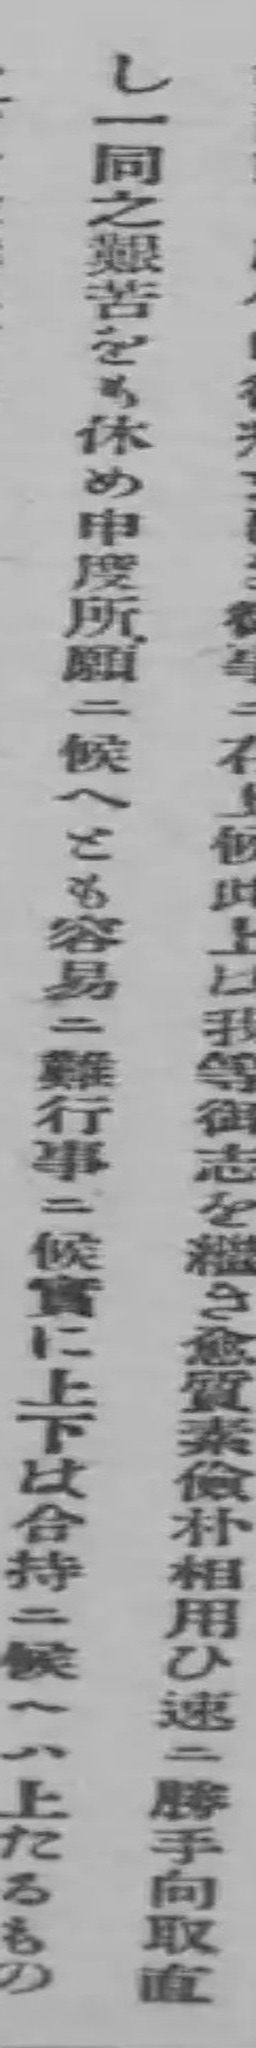し一同之艱苦をも休め申度所願ニ候へとも容易ニ難行事ニ候実に上下は合持ニ候ヘハ上たるもの
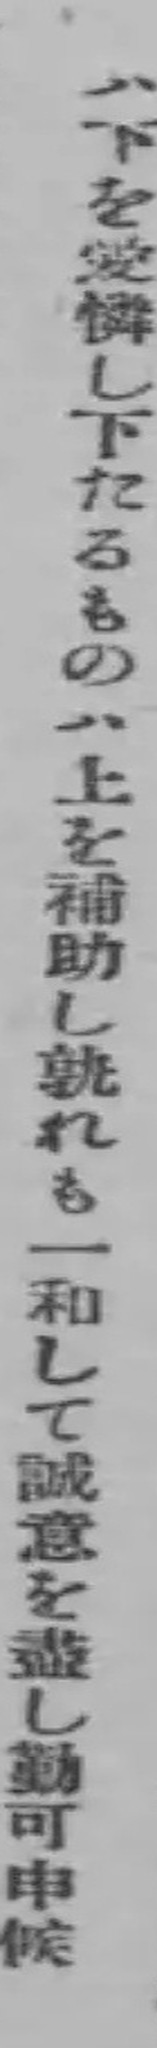ハ下を愛憐し下たるものハ上を補助し孰れも一和して誠意を尽し勤可申候
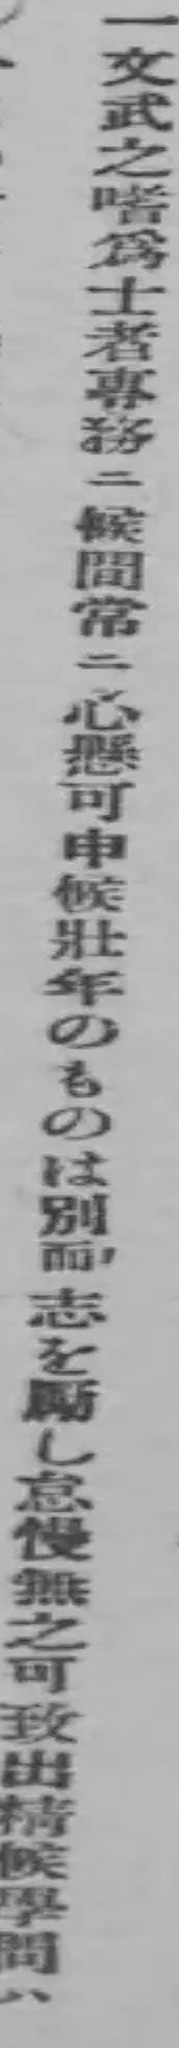一文武之嗜為士者専務ニ候間常ニ心懸可申候壮年のものは別而志を励し怠慢無之可致出精候学問ハ
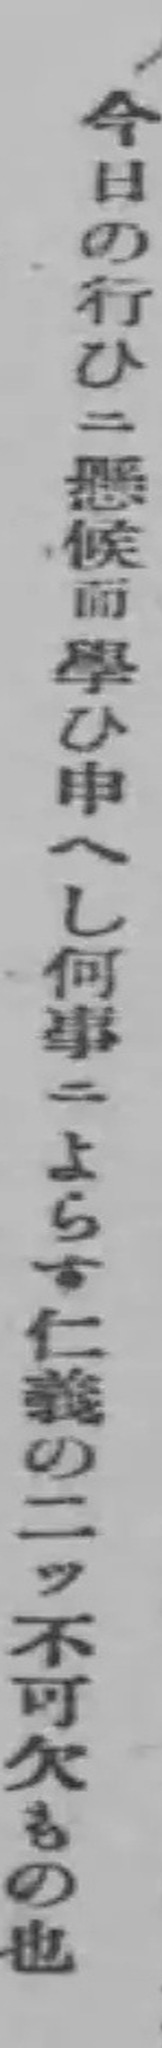今日の行ひニ懸候而学ひ申へし何事ニよらす仁義の二ツ不可欠もの也
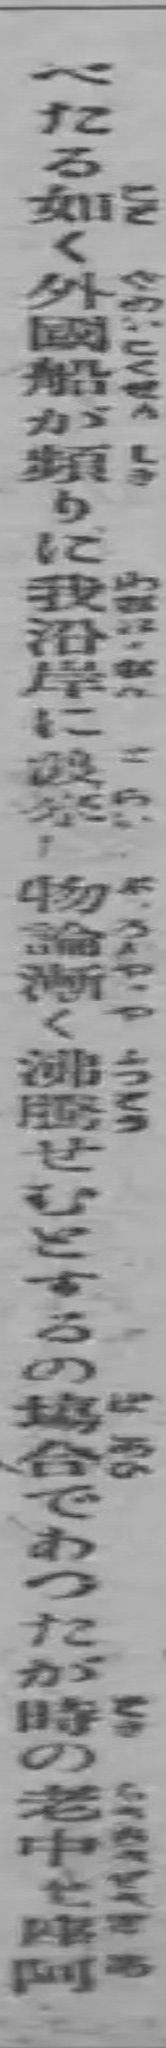べたる如く外国船が頻りに我沿岸に渡来し物論漸く沸騰せむとするの場合であつたが時の老中上座阿
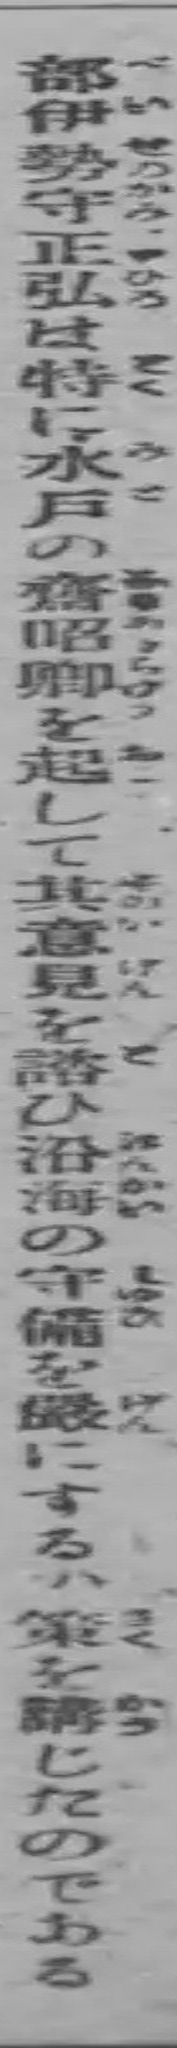部伊勢守正弘は特に水戸の斉昭卿を起して其意見を諮ひ沿海の守備を厳にするの策を講じたのである
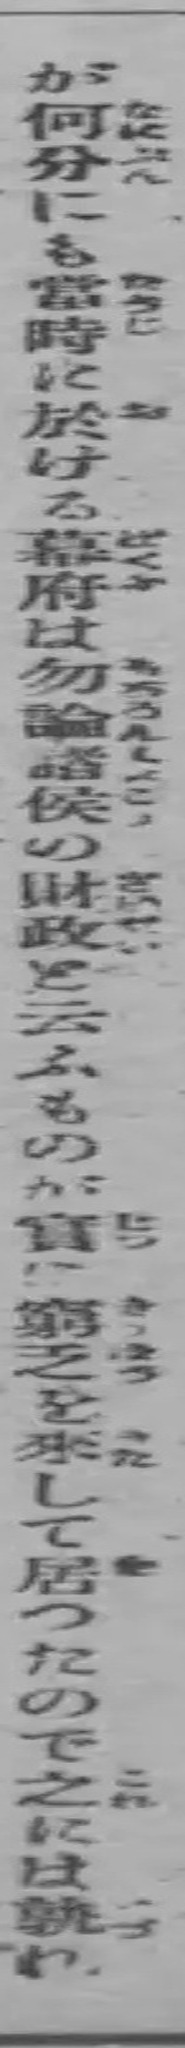が何分にも当時に於ける幕府は勿論諸侯の財政と云ふものが実に窮乏を来して居つたので之には孰れ
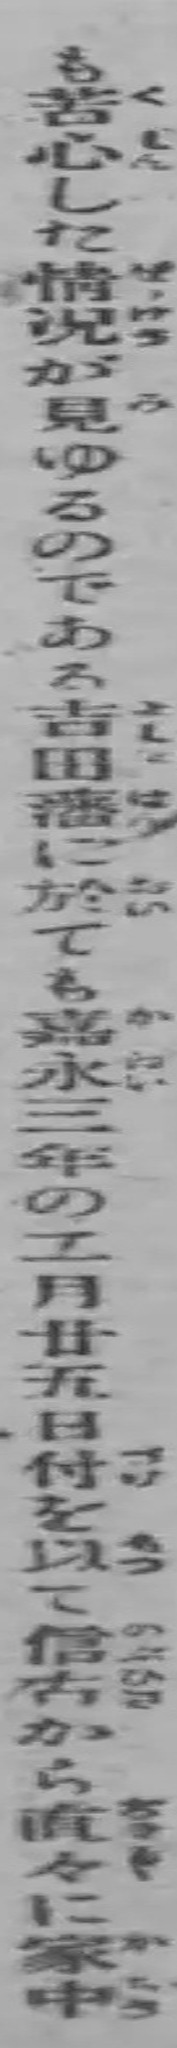も苦心した情況が見ゆるのである吉田藩に於ても嘉永三年の二月廿五日付を以て信古から直々に家中
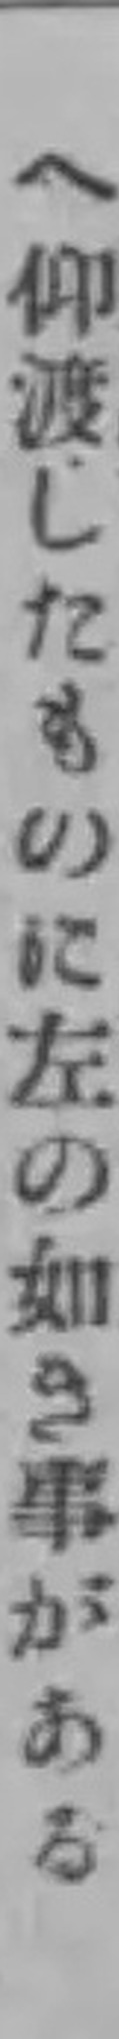へ仰渡したものに左の如き事がある
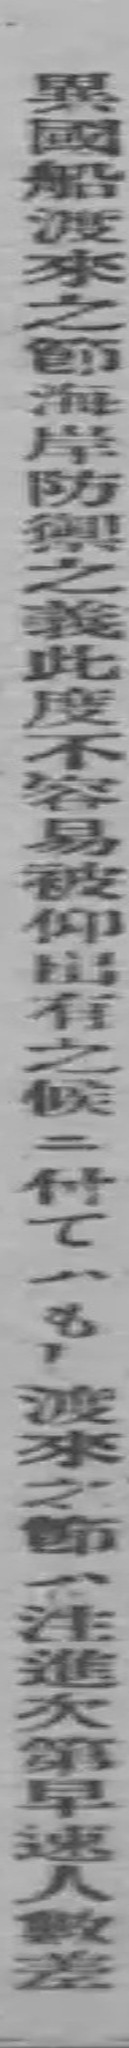異国船渡来之節海岸防禦之義此度不容易被仰出有之候ニ付てハもし渡来之節ハ注進次第早速人数差
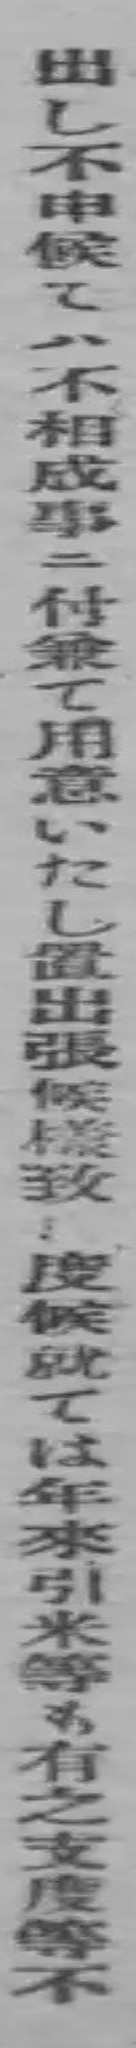出し不申候てハ不相成事ニ付兼て用意いたし置出張候様致し度候就ては年来引米等も有之支度等不
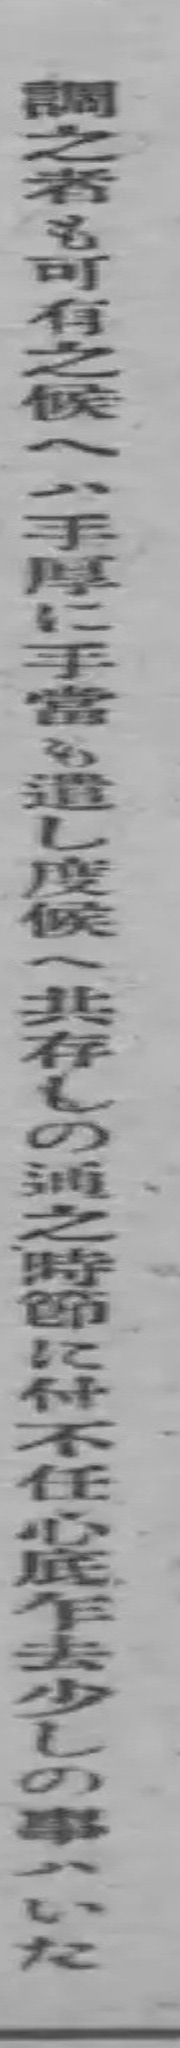調之者も可有之候へハ手厚に手当も遣し度候へ共存しの通之時節に付不任心底乍去少しの事ハいた
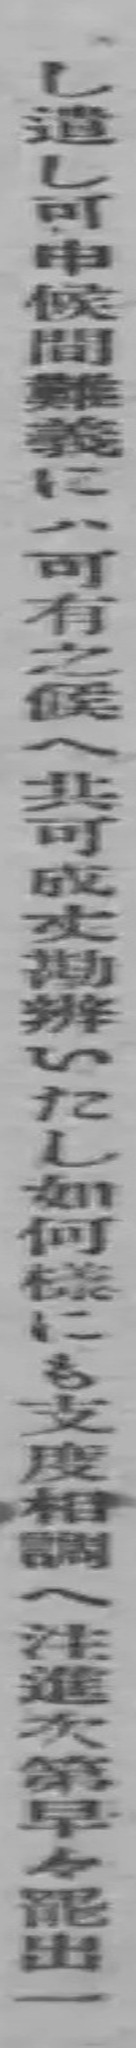し遣し可申候間難義にハ可有之候へ共可成丈勘弁いたし如何様にも支度相調へ注進次第早々罷出一
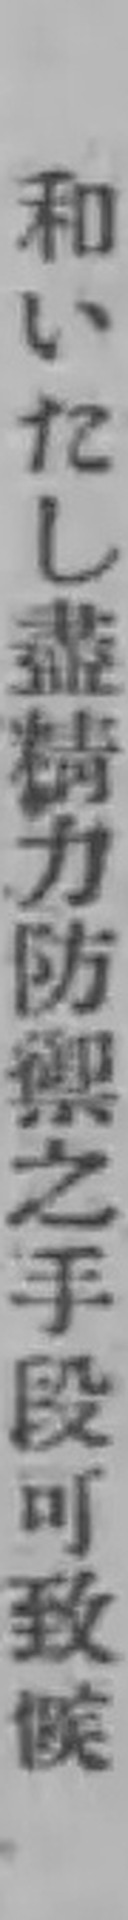和いたし尽精力防禦之手段可致候
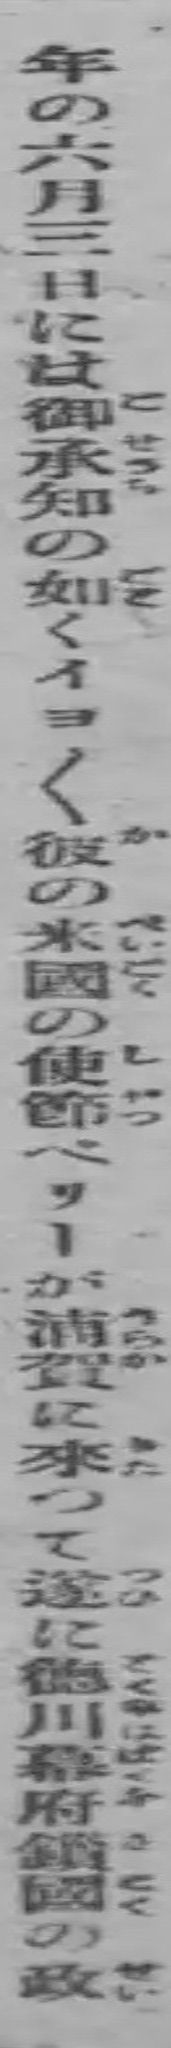年の六月三日には御承知の如くイヨ〳〵彼の米国の使節ペリーが浦賀に来つて遂に徳川幕府鎖国の政
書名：豊橋市史談
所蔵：国立国会図書館 National Diet Library, JAPAN
